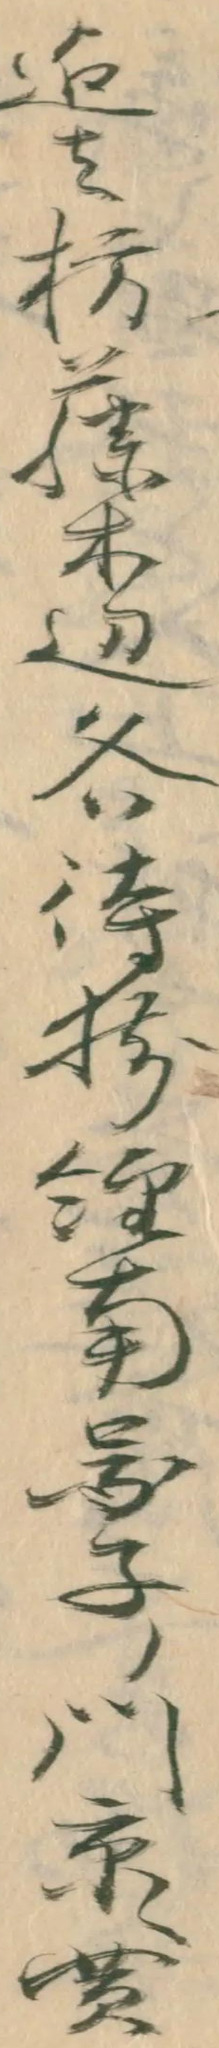迄は枋藤木辺各待揃経南図子の門京へ買
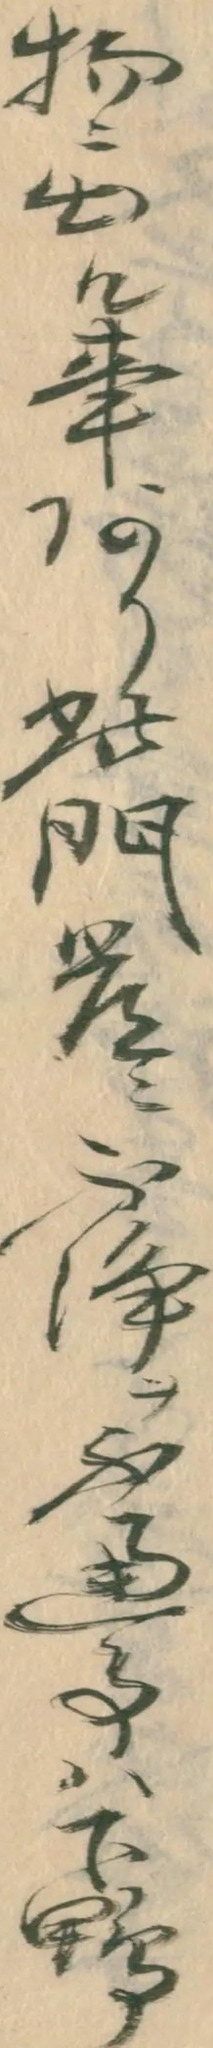物に出る事あり此門常に不浄を不通事は下鴨
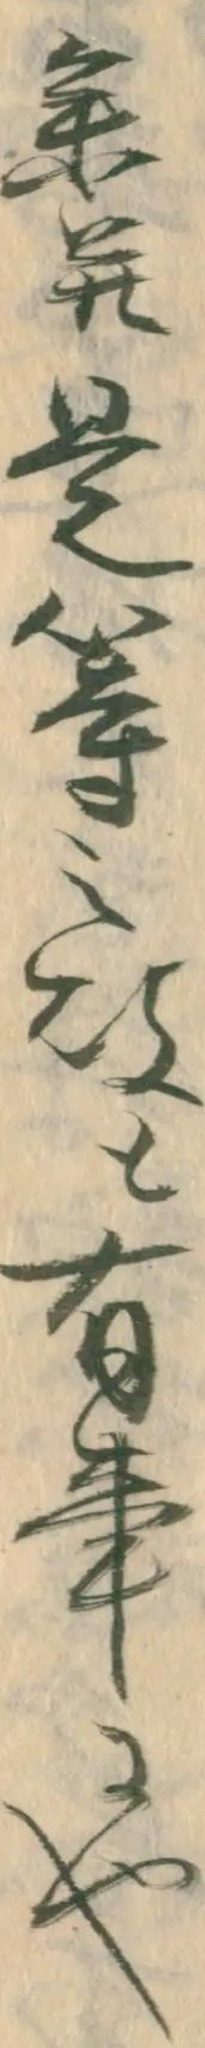参并是等之故も有事にや
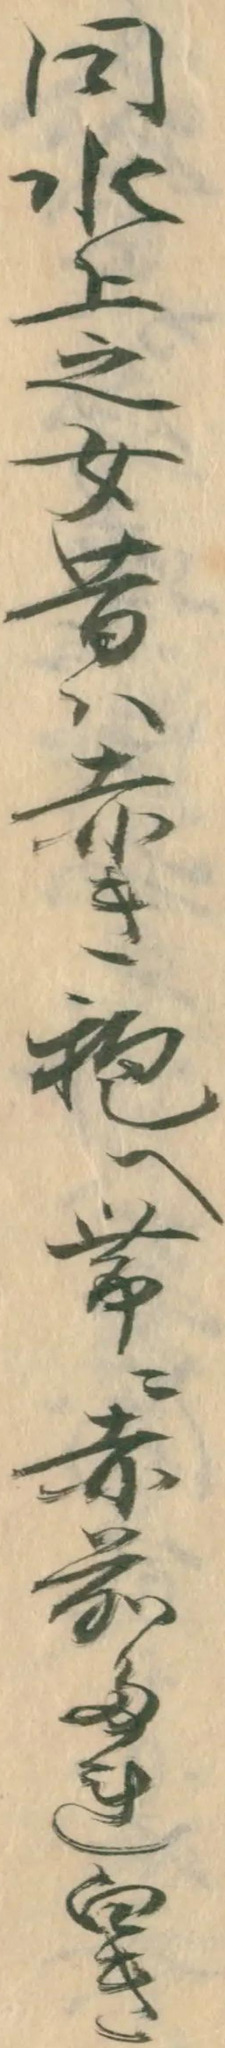同水上之女昔は赤き抱へ帯に赤前たれ白き

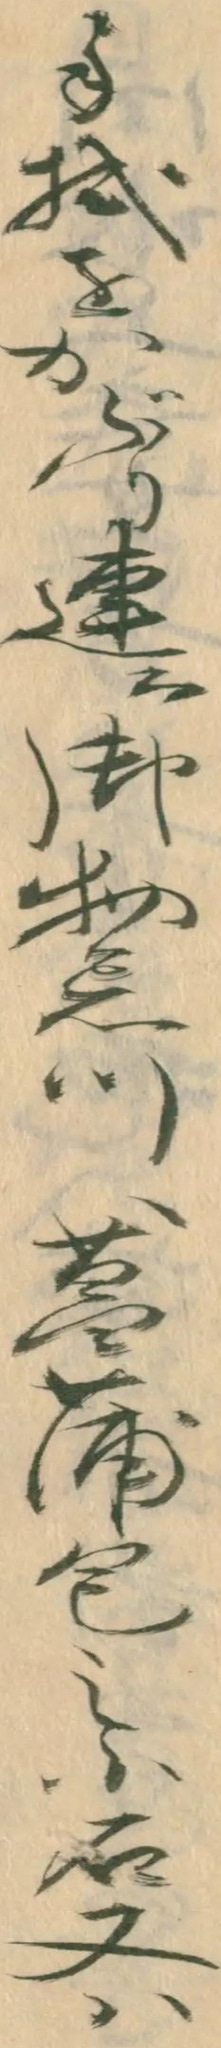手拭をかぶり連而御物忌川へ菖蒲包之小石又は
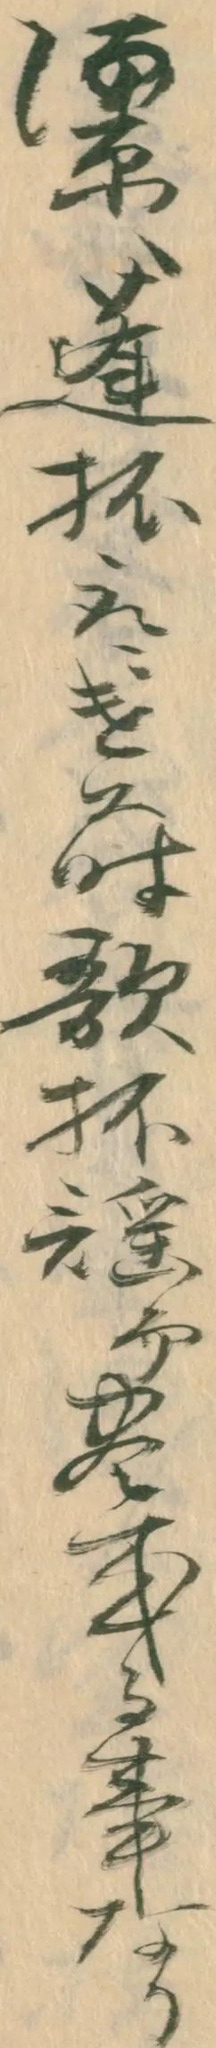河原へ蓬抔取に遣す時歌抔謡而豊成る事なり
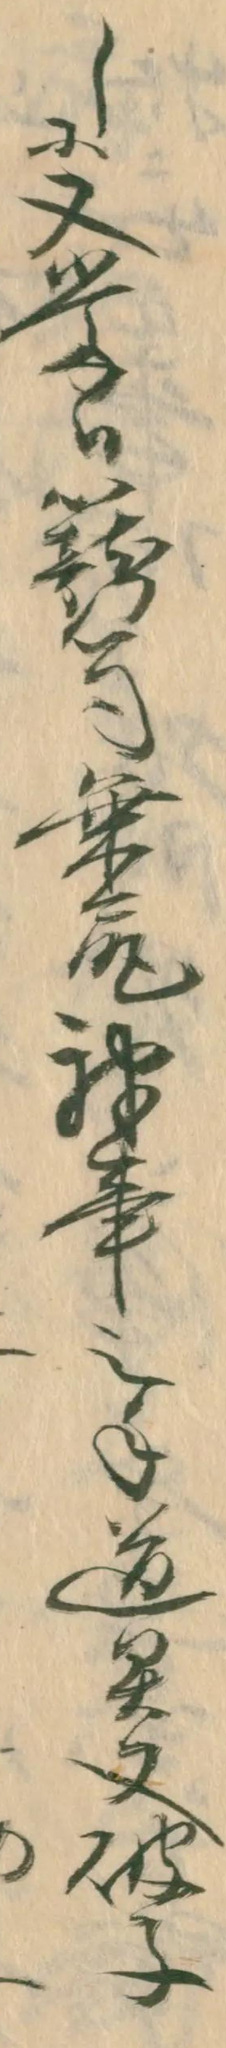しに又日籠笥乗尻神事之手道具又破子
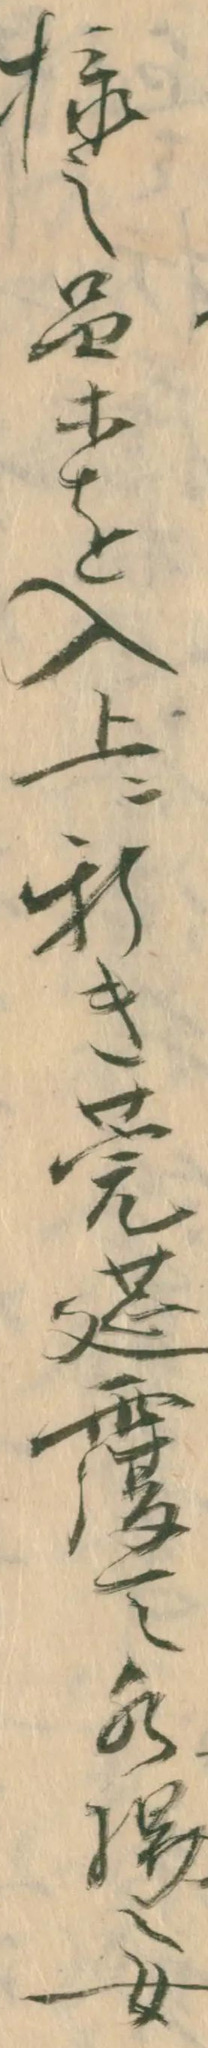様之品等を入上に新き莞莚覆て水揚之女
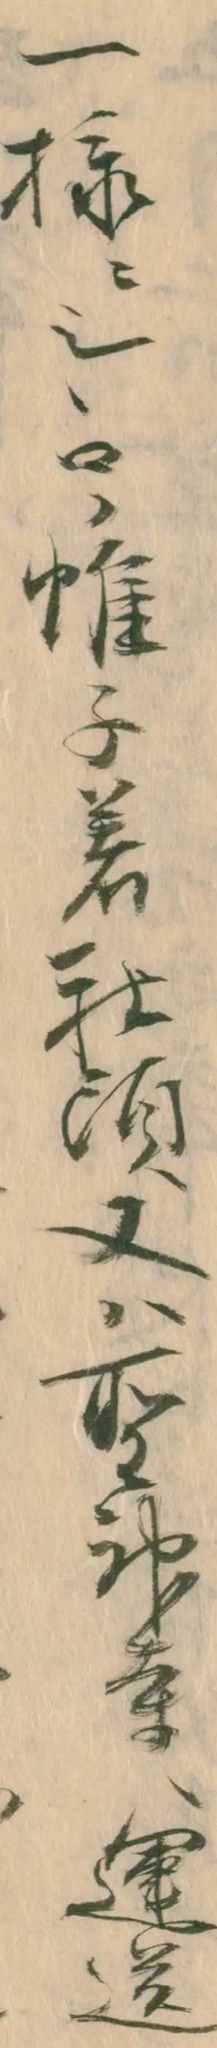一様にしゝろの帷子着社頭又は聖神寺へ運送
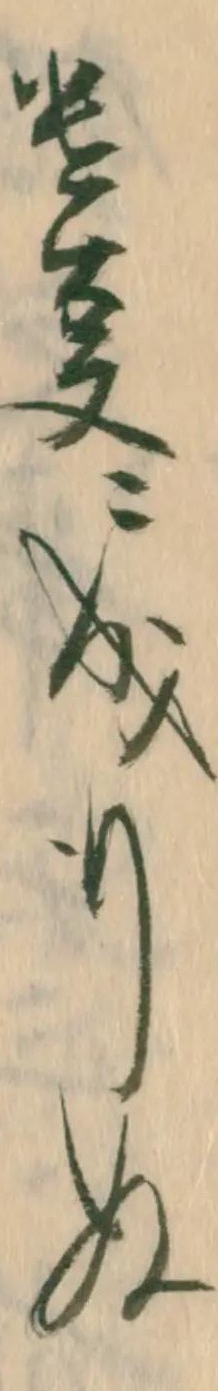遣事に成行ぬ
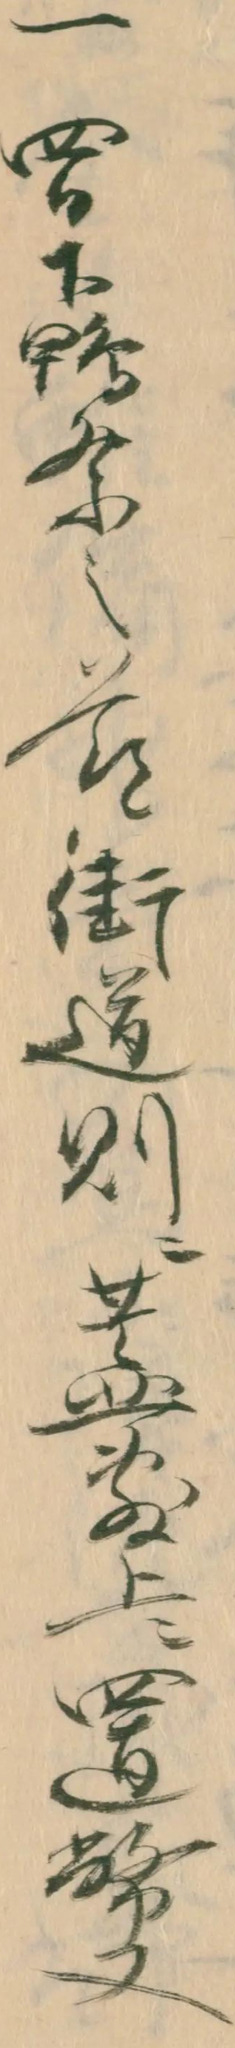一四日下鴨祭之節街道則に蓋敷上に置幣又
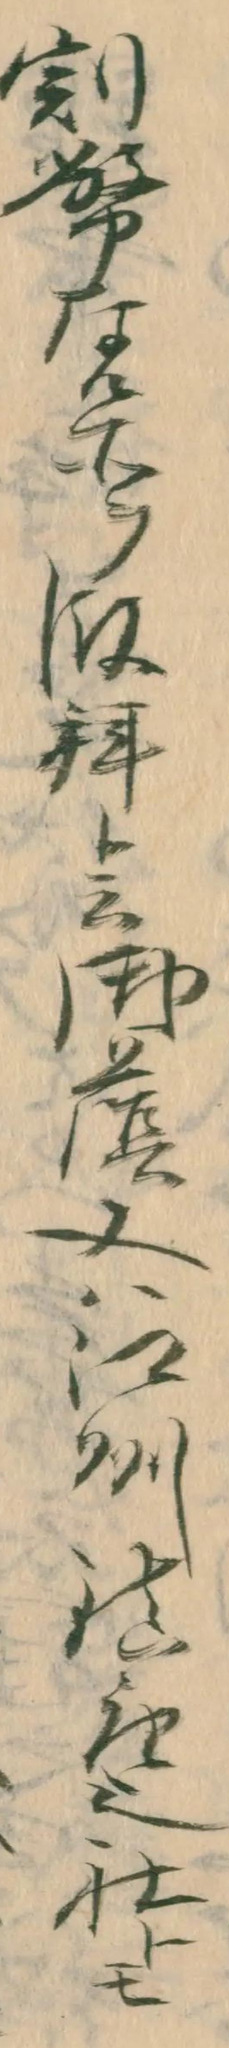割幣なる所を段拝と云御蔭又は江州鎮座也社とも
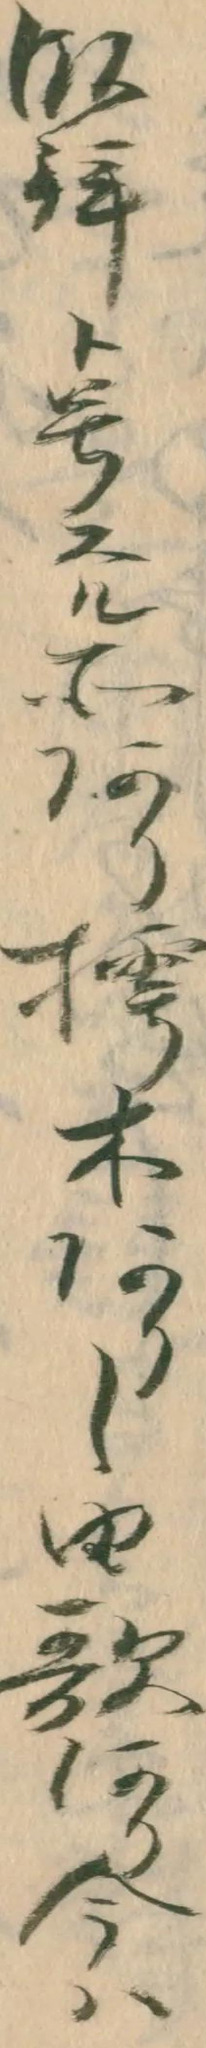段拝と号する所あり樗木ありし由歌あり今は
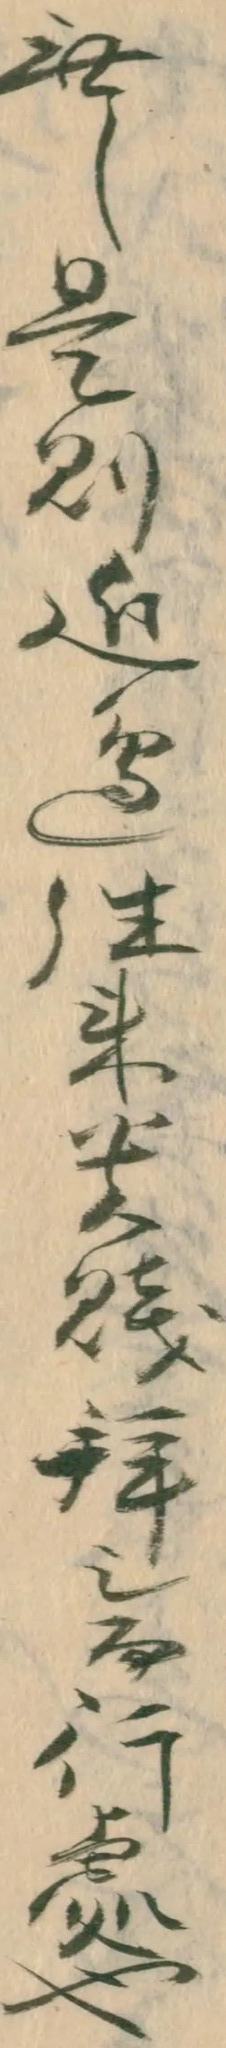無し是則近辺往来貴賤拝し而行処也
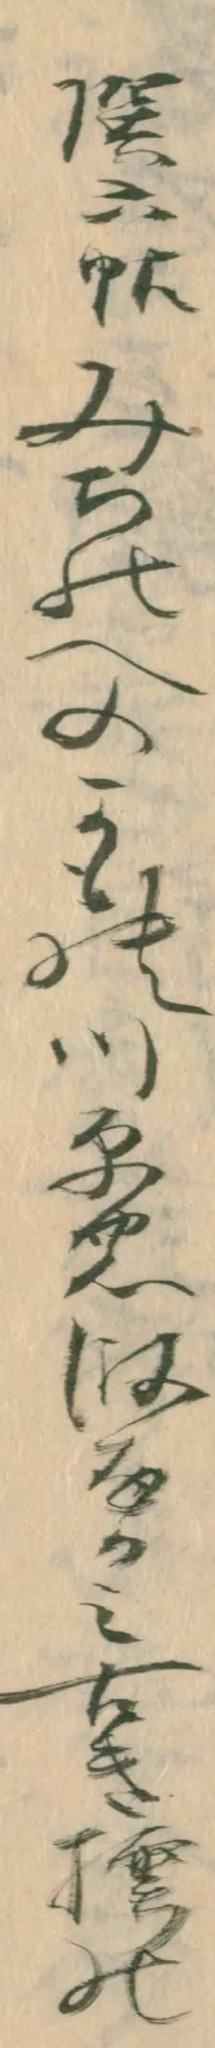撰六帖みちのへのかもの川原の波なかに古き樗の
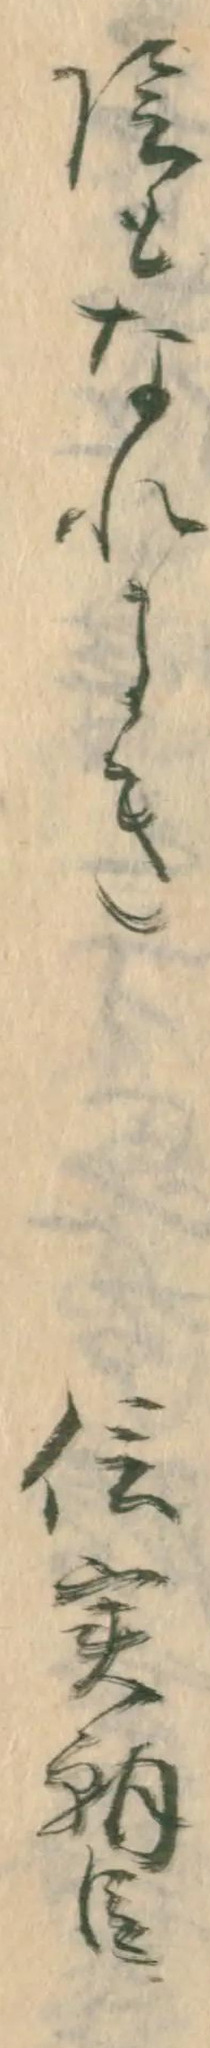陰もなれにき信実朝臣
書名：賀茂社記録. 第12冊
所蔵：国立国会図書館 National Diet Library, JAPAN
